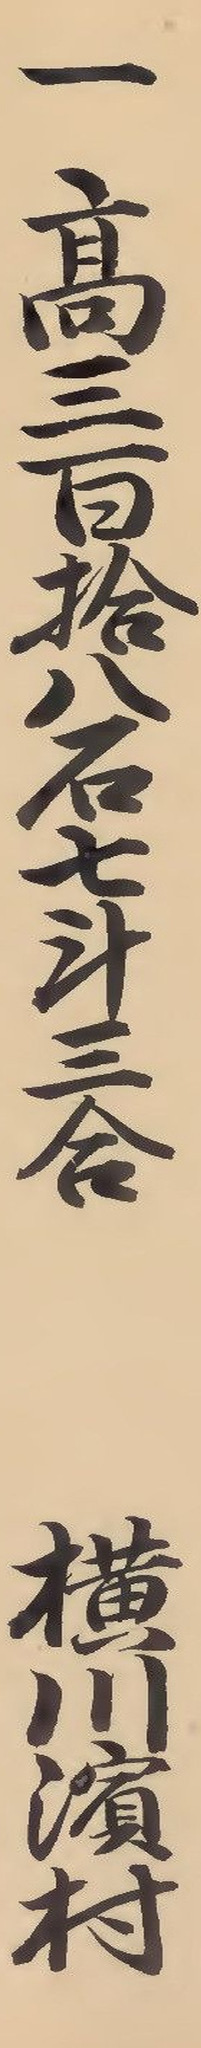一高三百拾八石七斗三合横川浜村
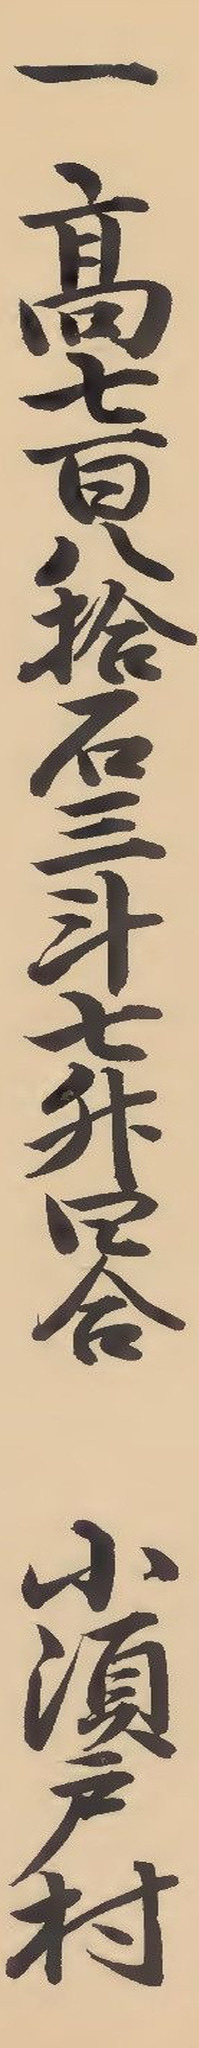一高七百八拾石三斗七升四合小須戸村
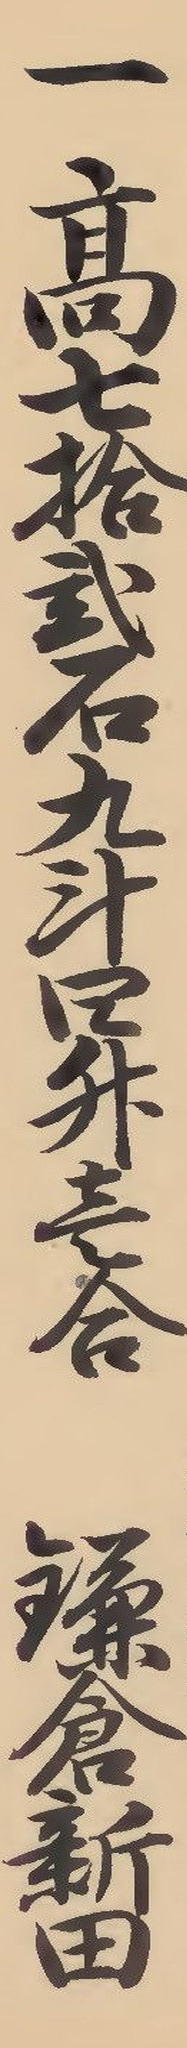一高七拾弐石九斗四升壱合鎌倉新田

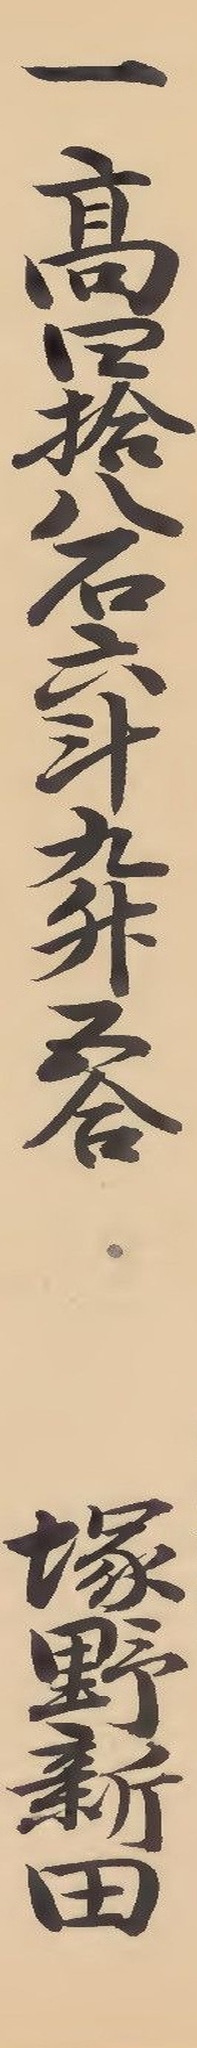一高四拾八石六斗九升五合塚野新田
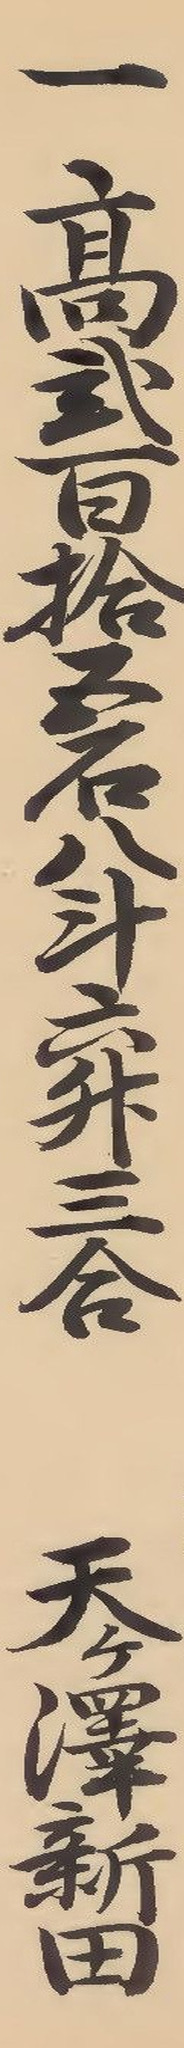一高弐百拾五石八斗六升三合天ヶ沢新田
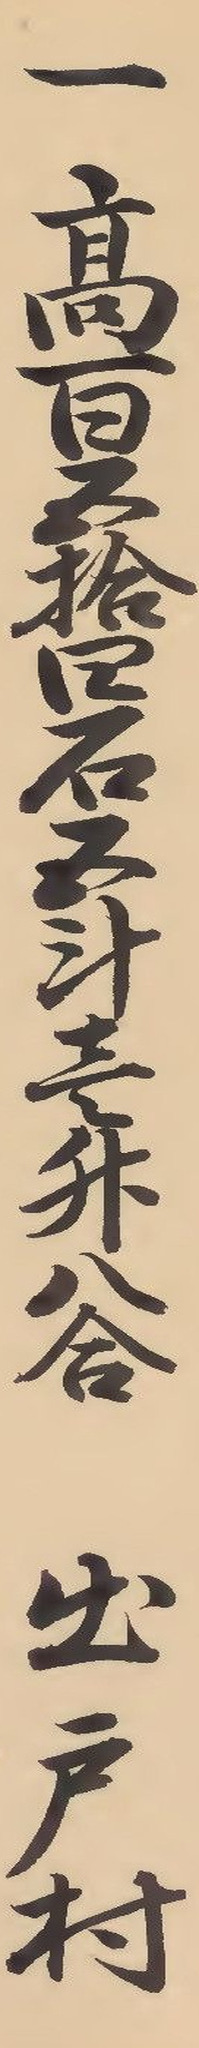一高百五拾四石五斗壱升八合出戸村
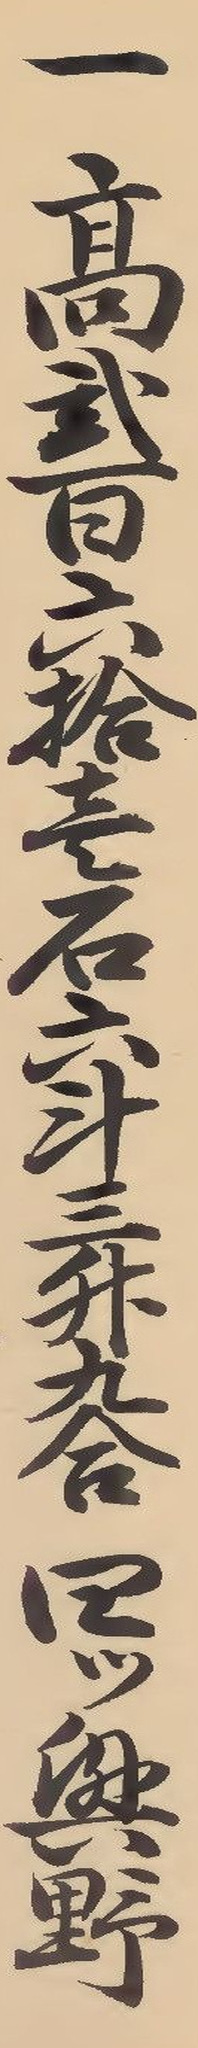一高弐百六拾壱石六斗三升九合四ツ興野
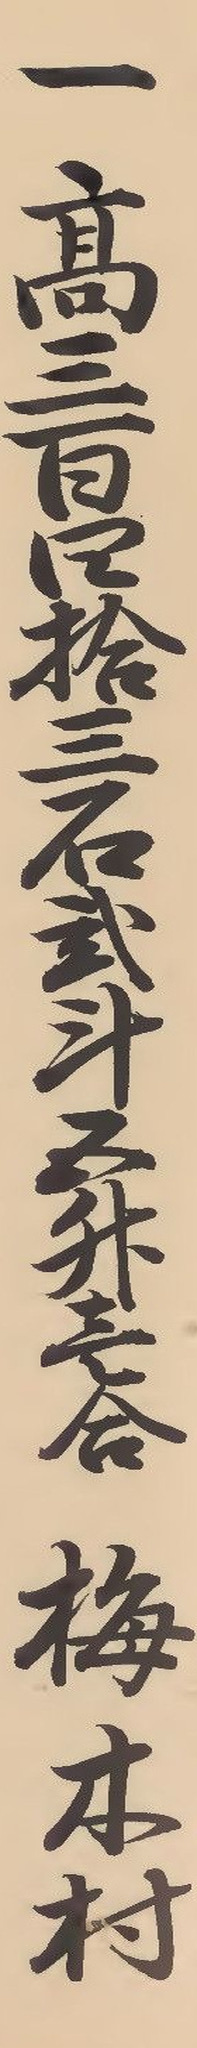一高三百四拾三石弐斗五升壱合梅木村
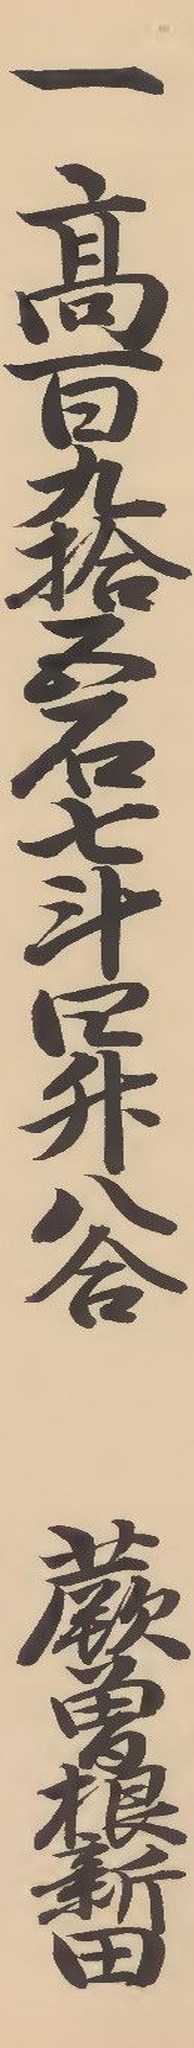一高百九拾五石七斗四升八合蕨曽根新田
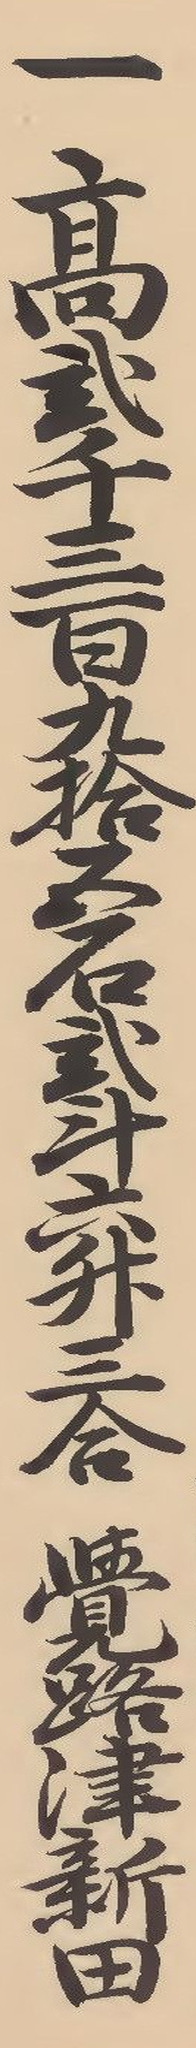一高弐千三百九拾五石弐斗六升三合覚路津新田
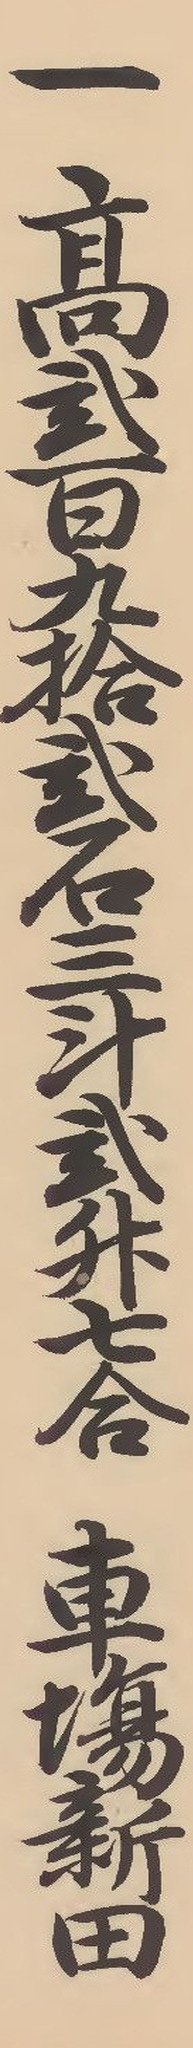一高弐百九拾弐石三斗弐升七合車場新田

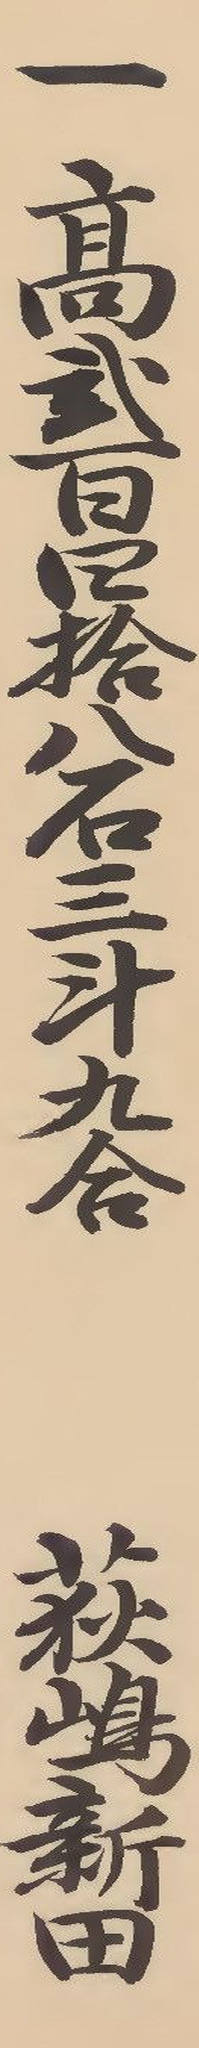一高弐百四拾八石三斗九合荻島新田
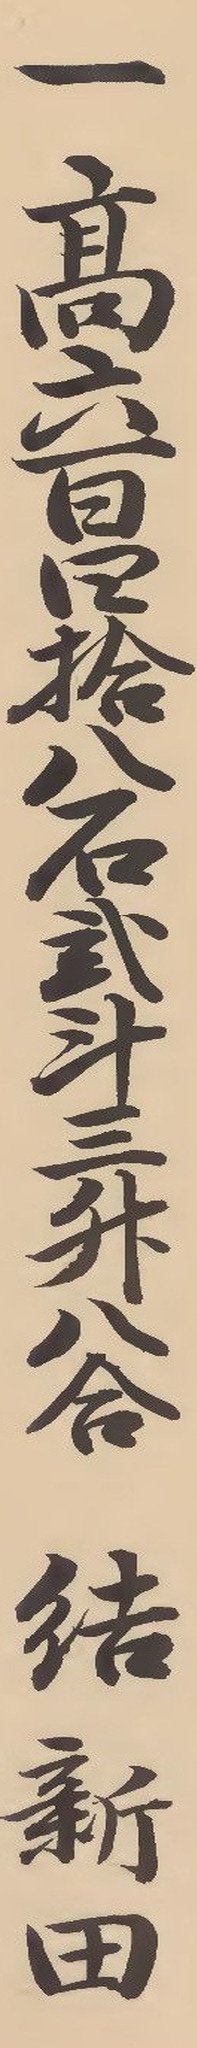一高六百四拾八石弐斗三升八合結新田
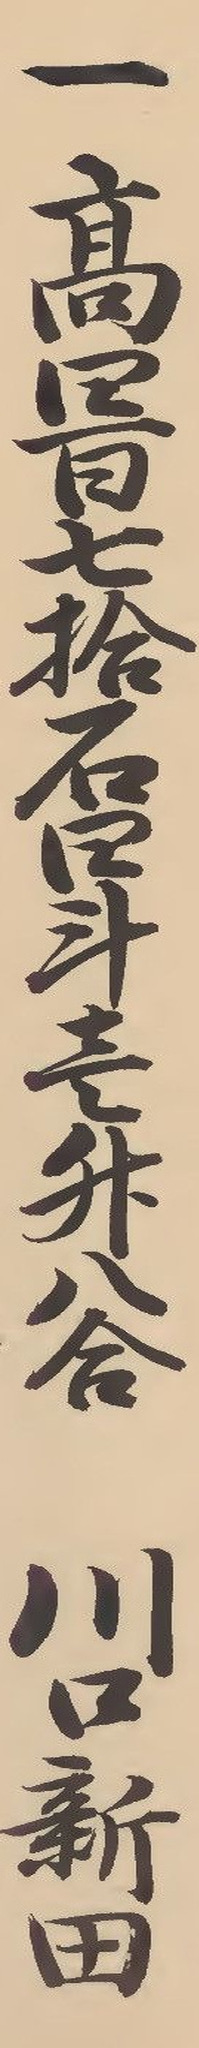一高四百七拾石四斗壱升八合川口新田
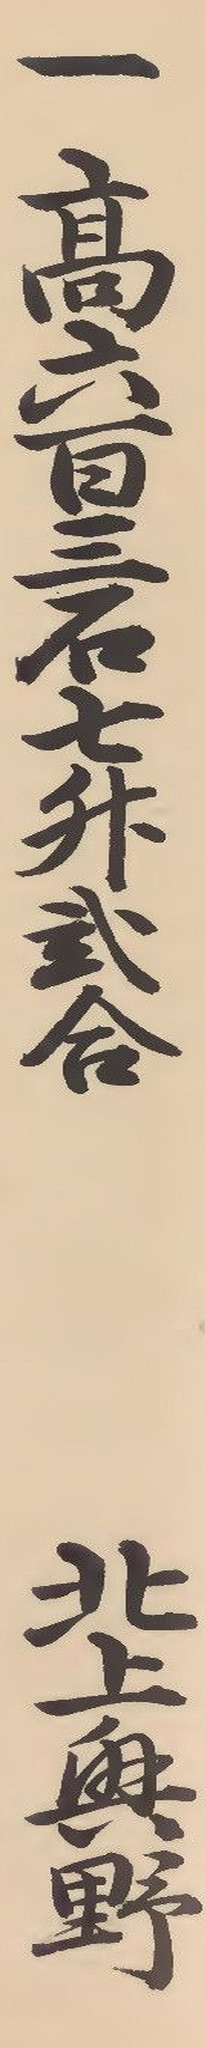一高六百三石七升弐合北上興野
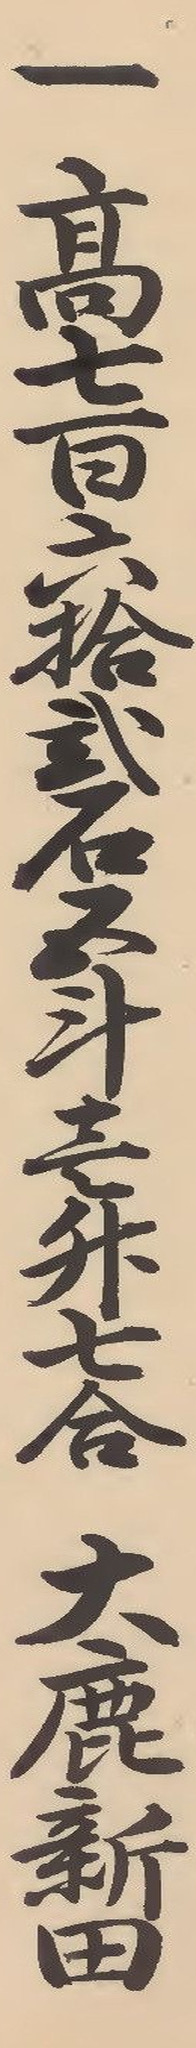一高七百六拾弐石五斗壱升七合大鹿新田
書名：越後国郷帳　下
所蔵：国立公文書館 National Archives of Japan
